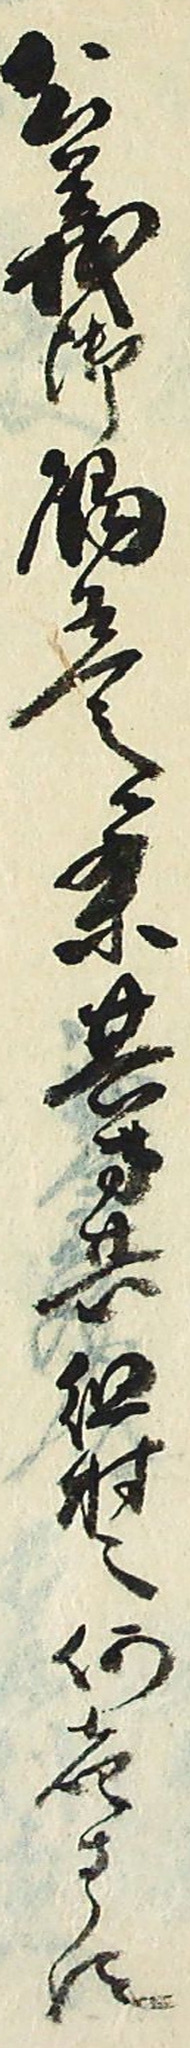公義御触有之候条其方共組村々何者によらす
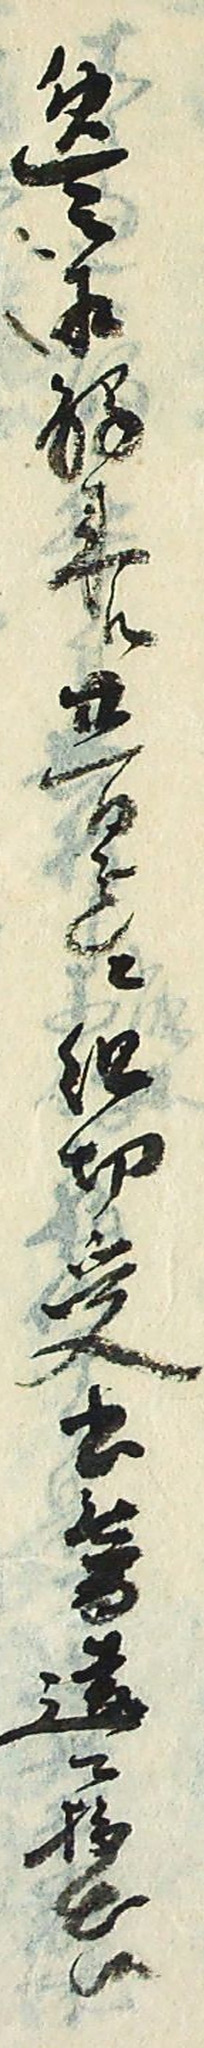逸々相触来る廿一日迄に組切受書無間違可指出候
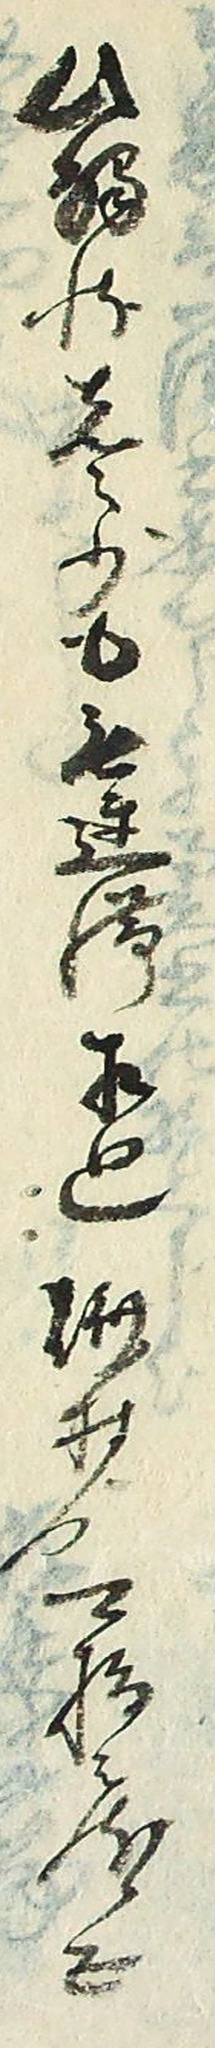此触状先々少も無遅滞相廻済村ゟ可指戻候以上
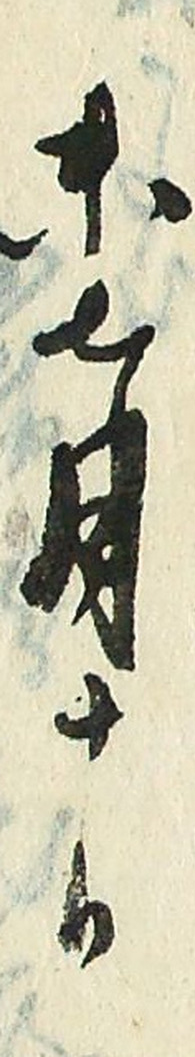未七月十日

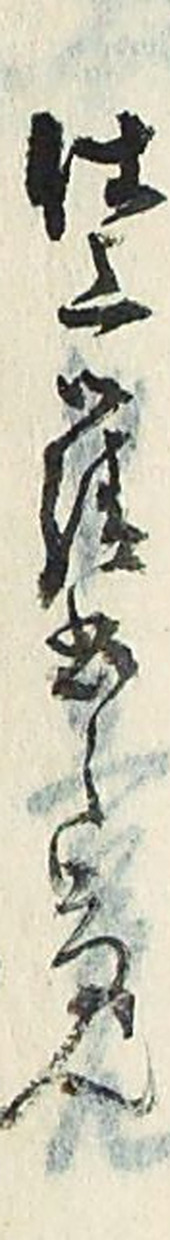仕上御請書之覚
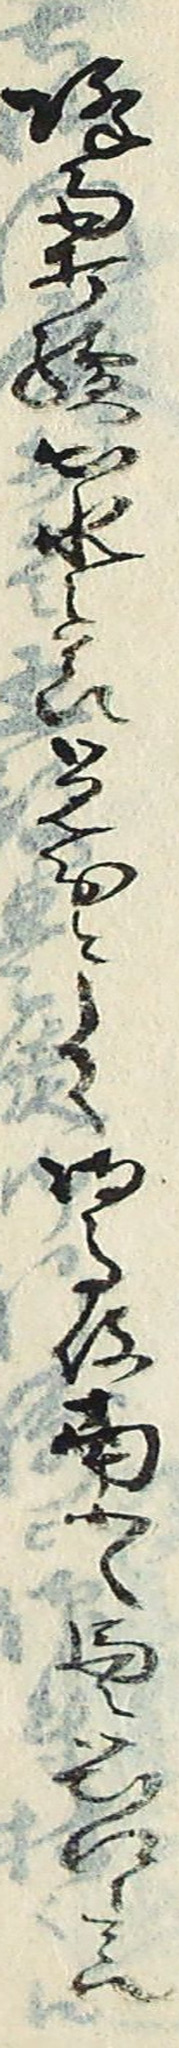降雨打続出水之節御見分として御馬役南北へ馬々御出郷之節
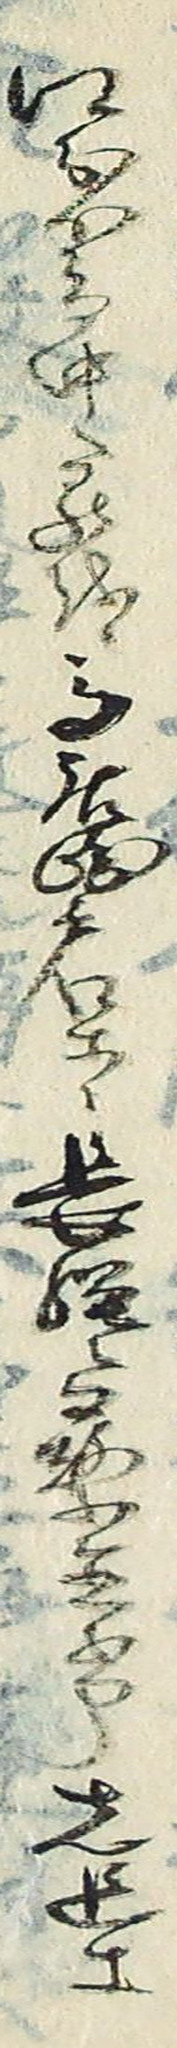郷分ゟ市中へ罷越候馬居崎戸口等に長縄に而繋置不申先追等
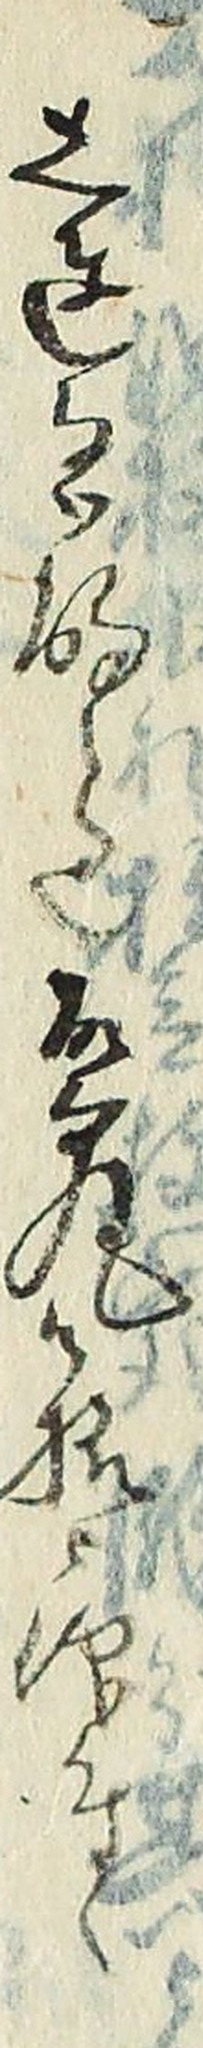先達而御触之通取究候様被仰付候
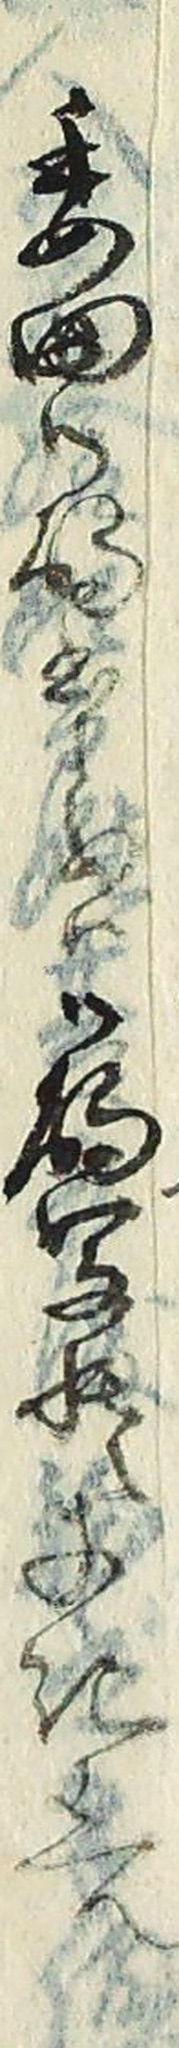委曲御触書之義は御触写帳に相記有之
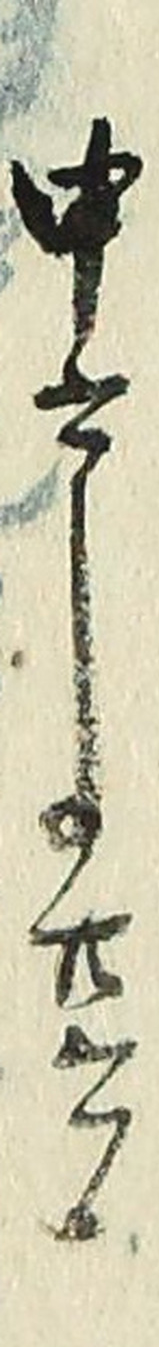申六月廿六日
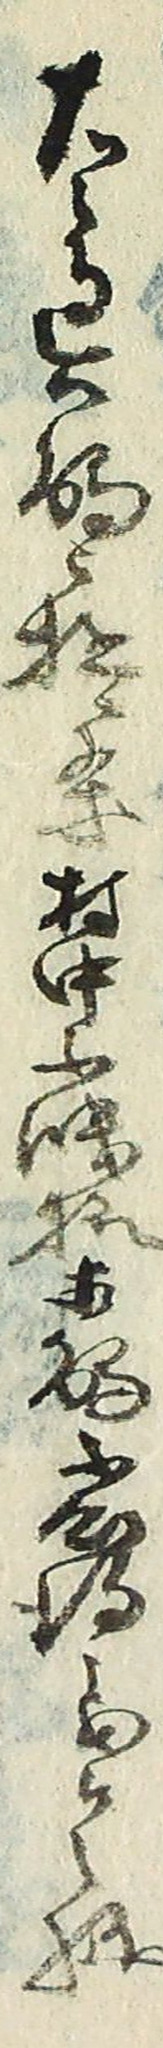右之通御触被遊候条村中不洩様相触不心得之義無之様
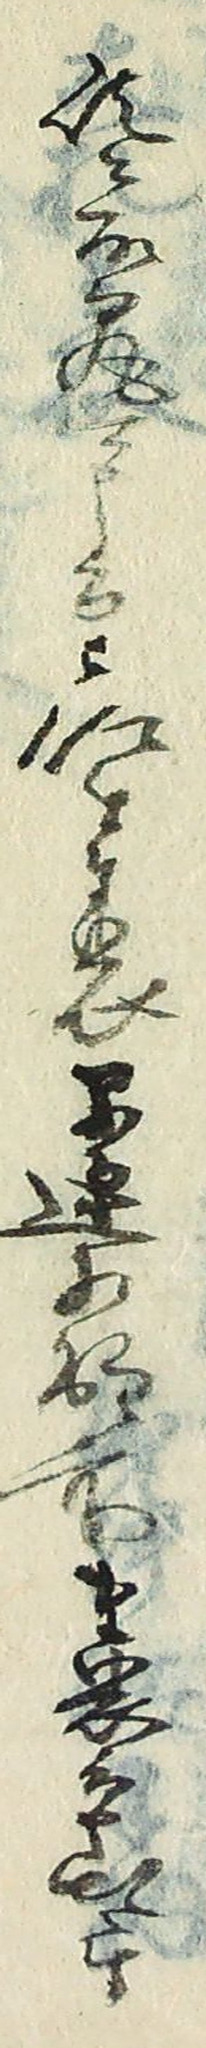屹と取究可申旨被仰付奉畏早速相触候所奉畏旨申出候に付
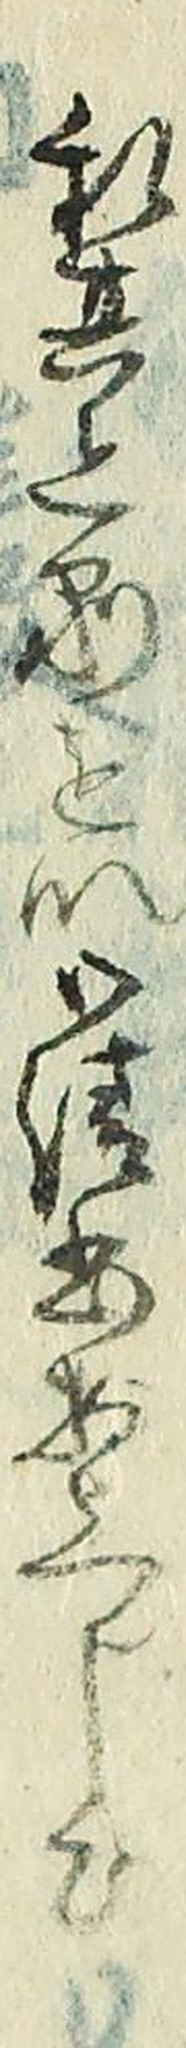私共連判を以御請書指上申候以上
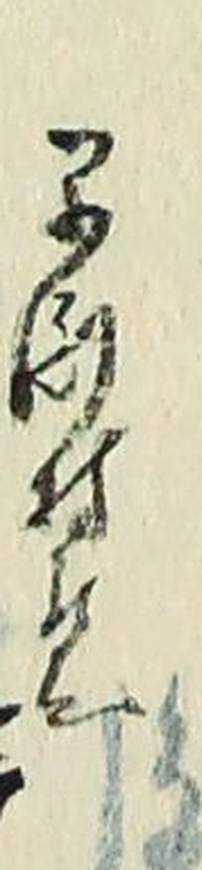早淵村庄屋
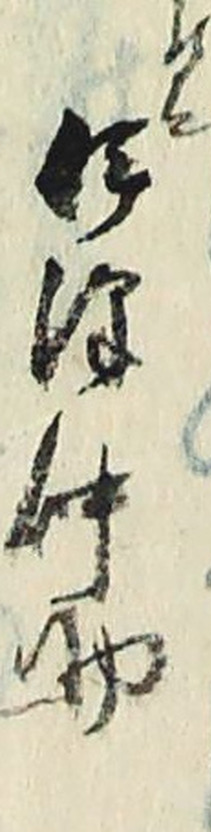伊澤仲助
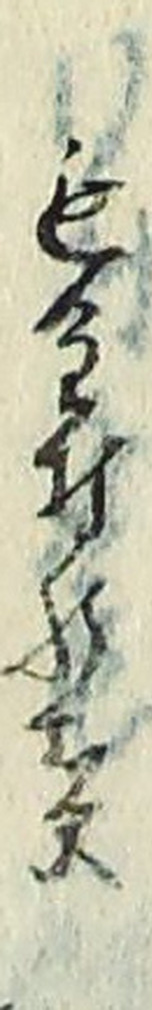矢野村肝煎
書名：諸御用御□受書控
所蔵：鳴門教育大学 Naruto University of Education
